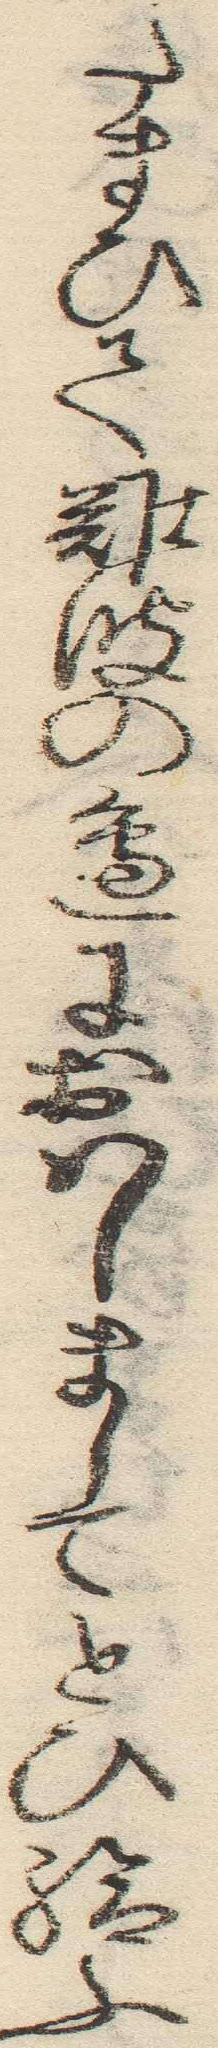たまひて難波の辺におはしましてとひ給ふ
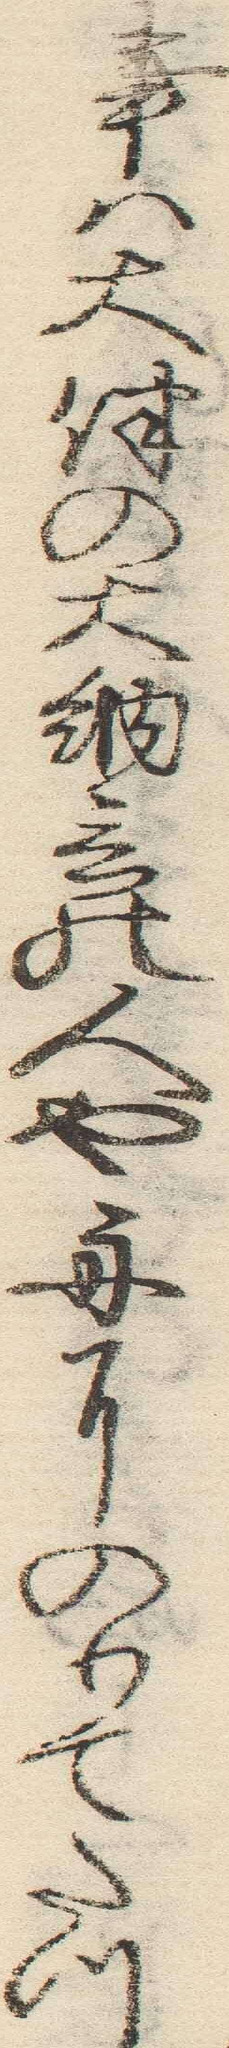事は大伴の大納言の人や舟にのりてたつ
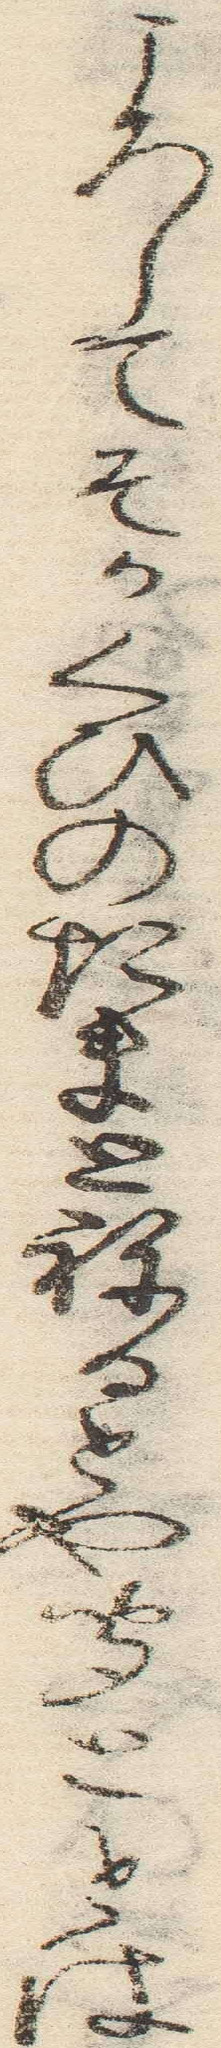ころしてそかくひのたまとねるとや聞ととは
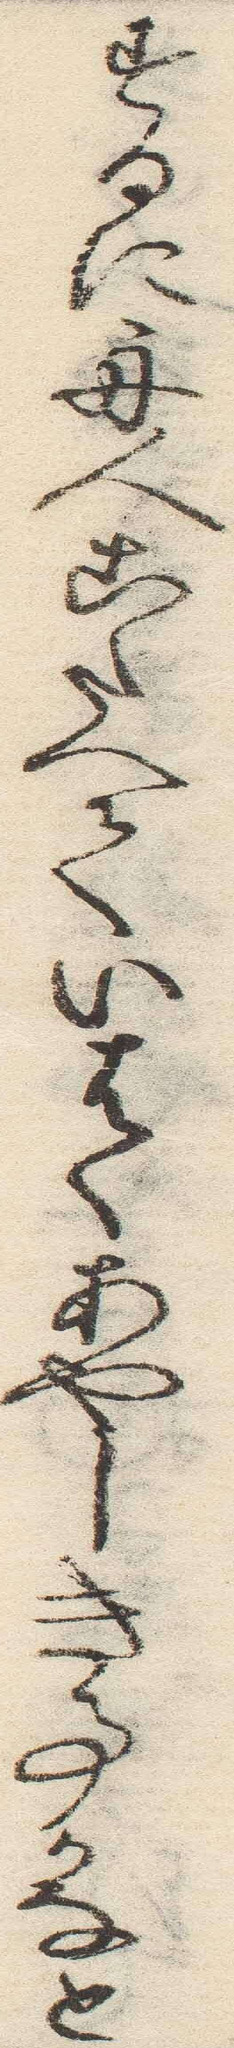するに舟人こたへていはくあやしき事かなと
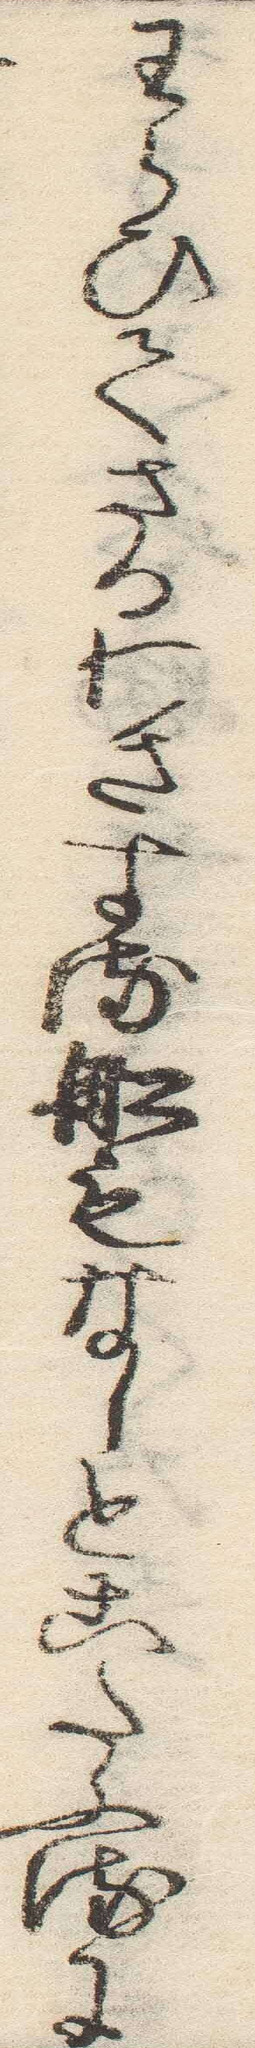わらひてさるわさする船もなしとこたふるに
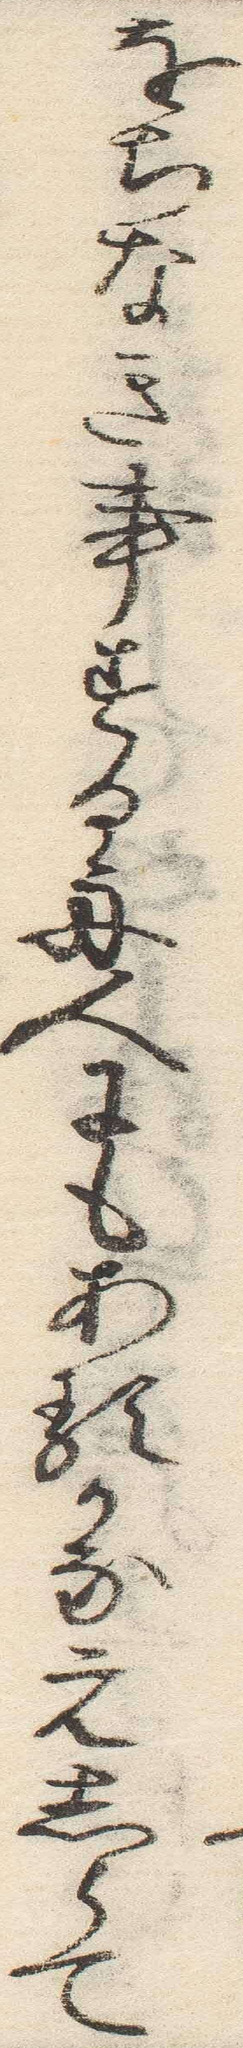をちなき事する舟人にもあるかなえしらて
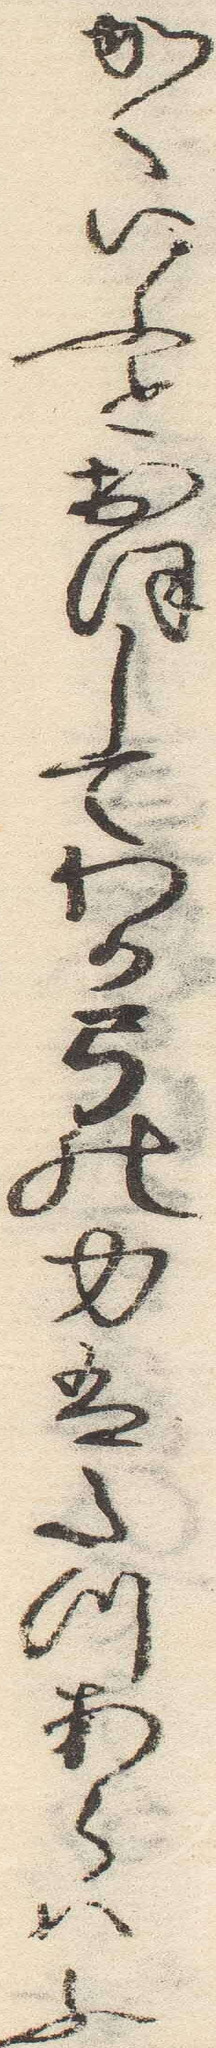かくいふとおほしてわか弓の力はたつあらはふ
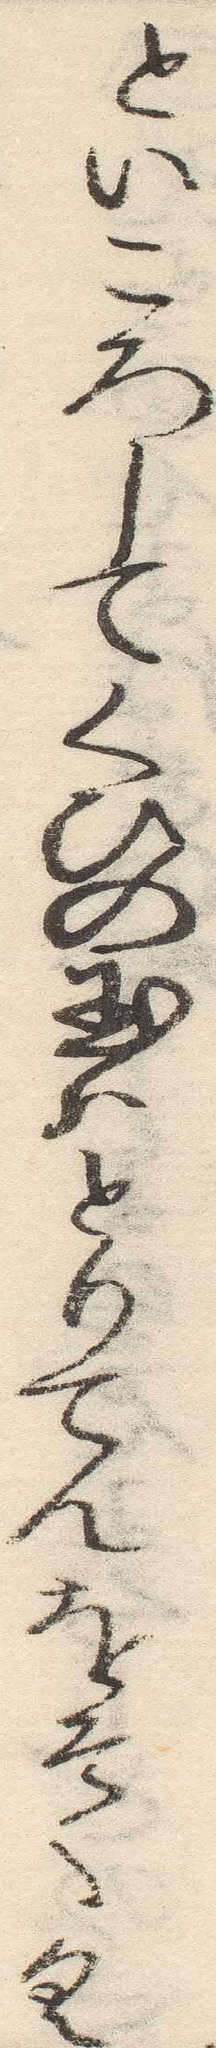といころしてくひの玉はとりてんをそくく
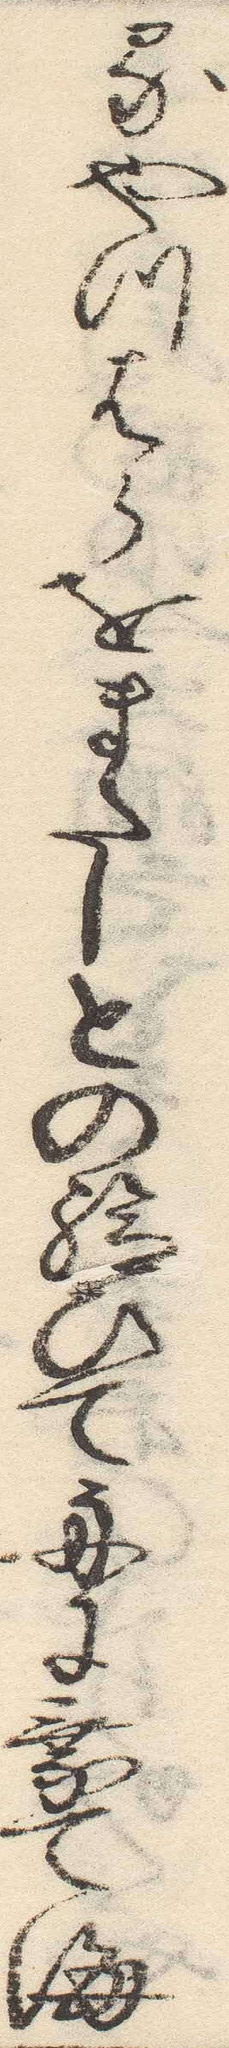るやつはらをまたしとの給ひて舟に乗て海
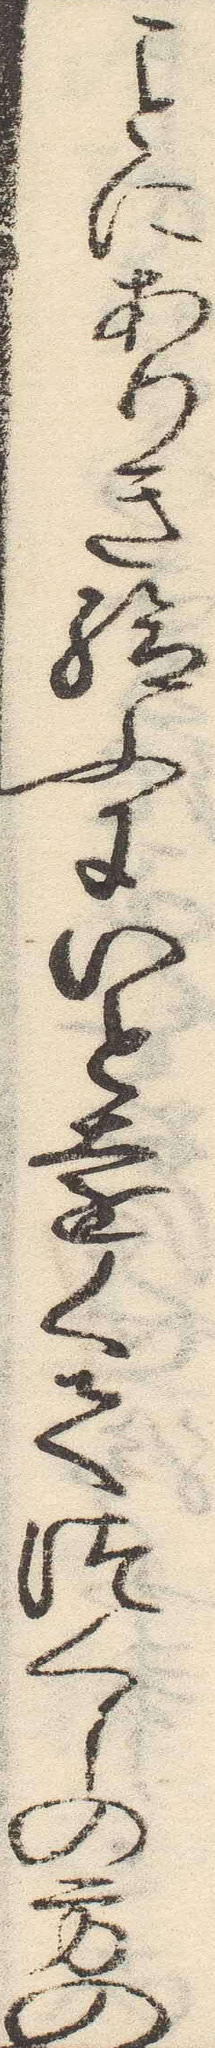ことにありき給ふにいと遠くてつくしの方の
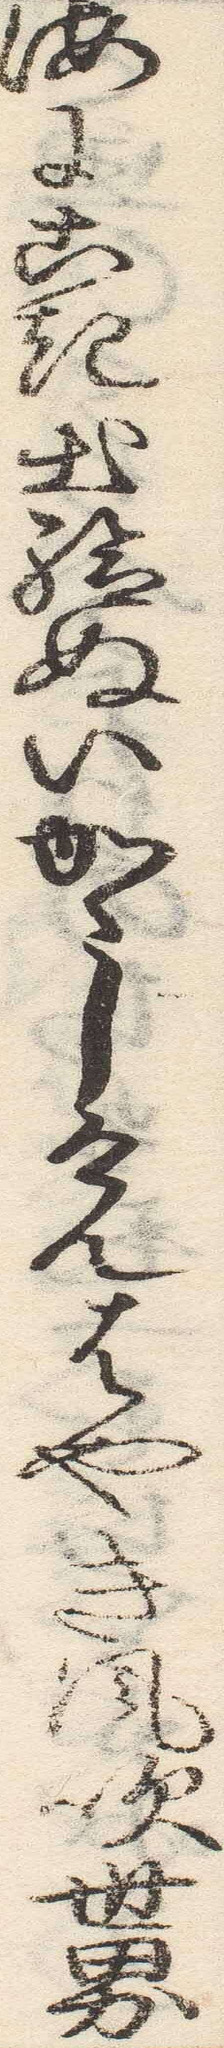海にこき出給ぬいかゝしけんはやき風吹世界
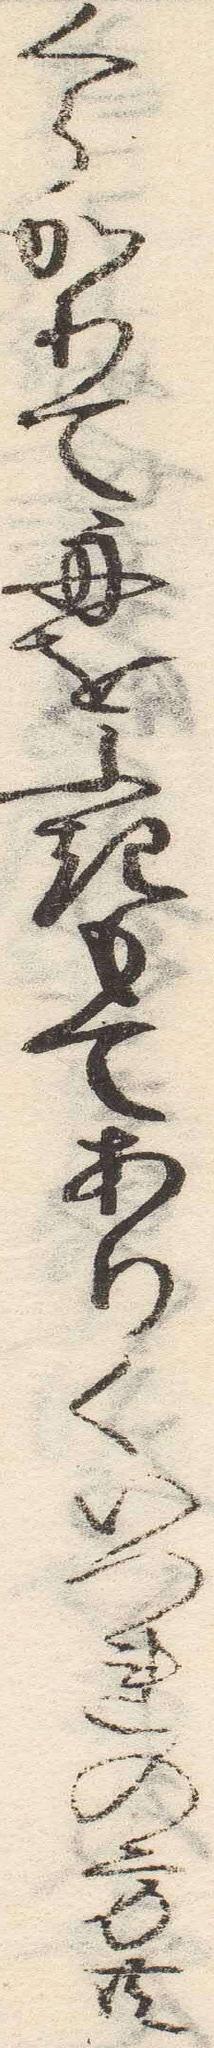くらかりて舟をふきもてありくいつれの方共
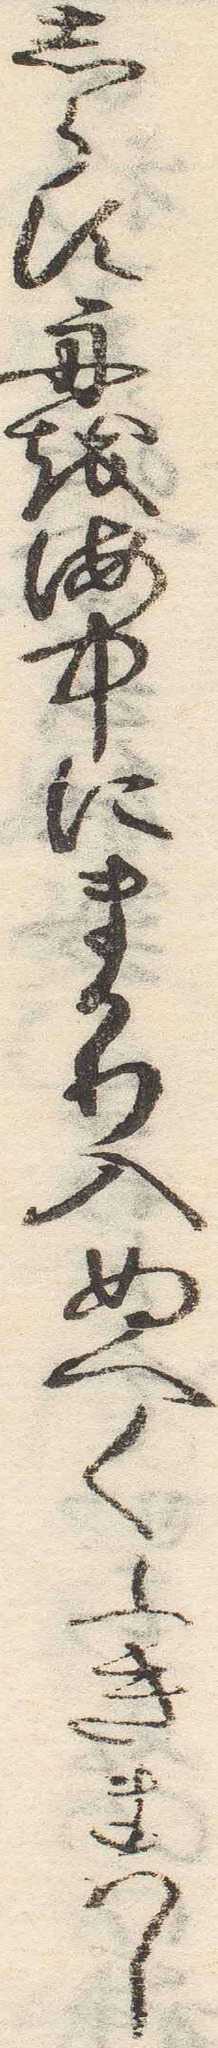しらす舟を海中にまかり入ぬへくふきまはし
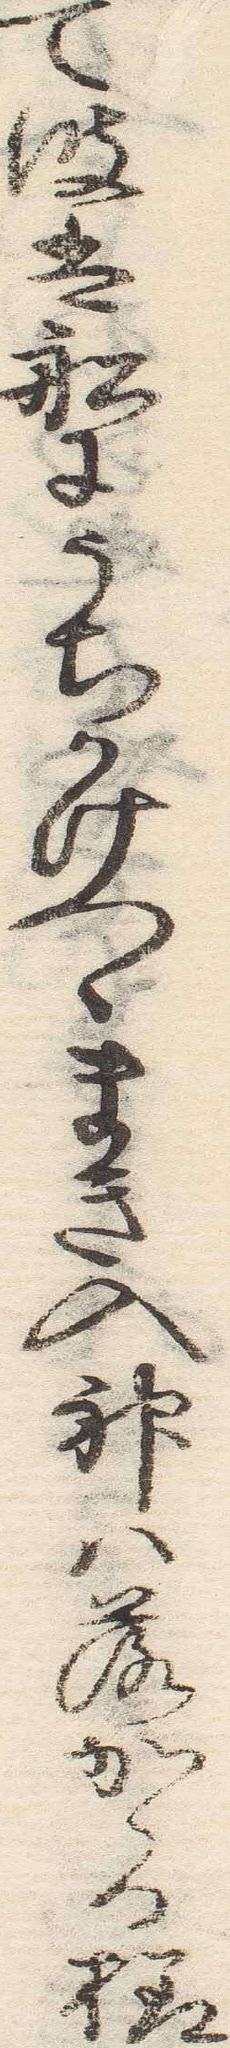て波は船にうちかけつゝまき入神は落かゝる様
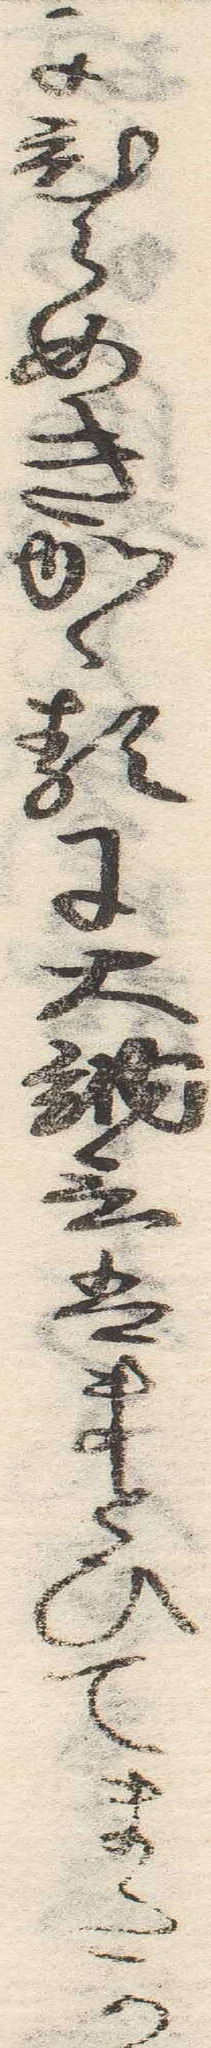にひらめきかゝるに大納言はまとひてまたか
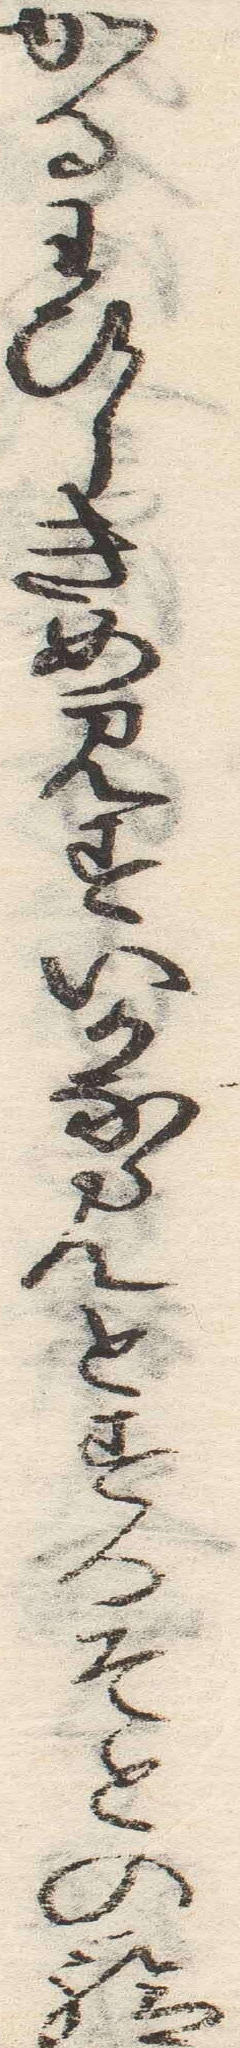かるわひしきめ見すいかならんとするそとの給
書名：竹取物語
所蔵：東京学芸大学附属図書館 国文学研究資料館
